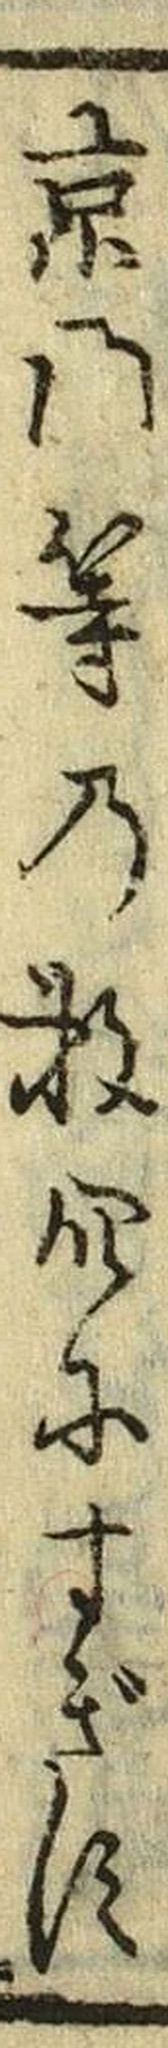京門等の数穴にすぎす
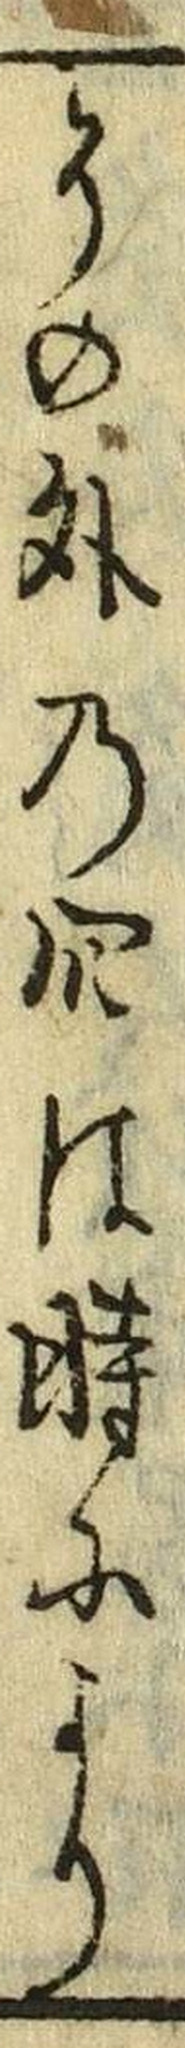その外の穴は余騎により
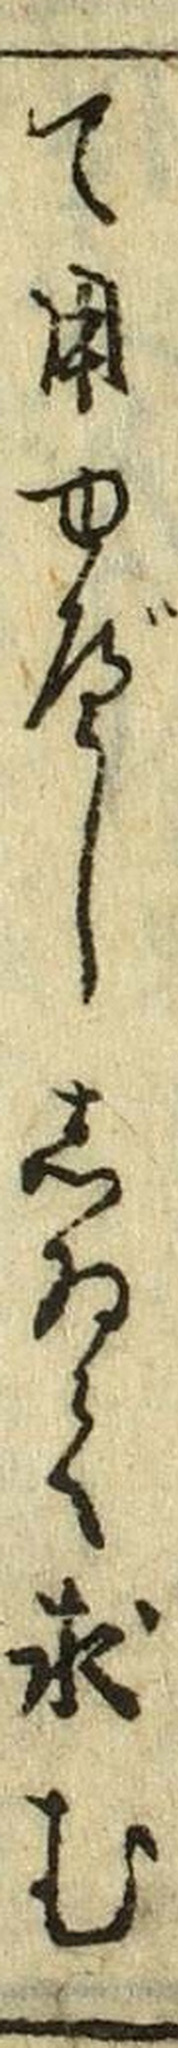て用ゆべししゐて求む
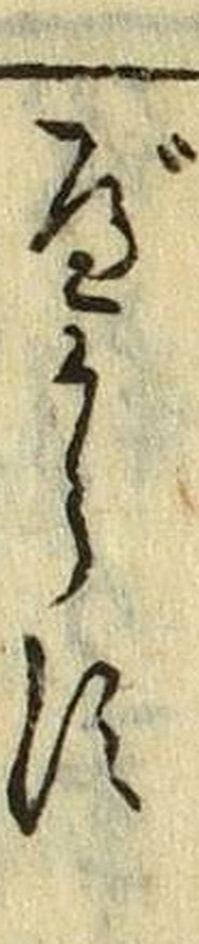べからす
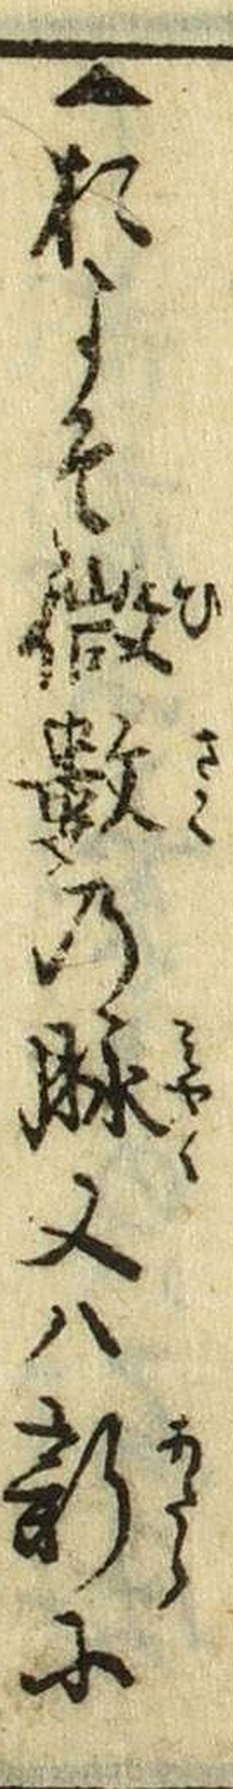▲およそ微数の脈又は新に
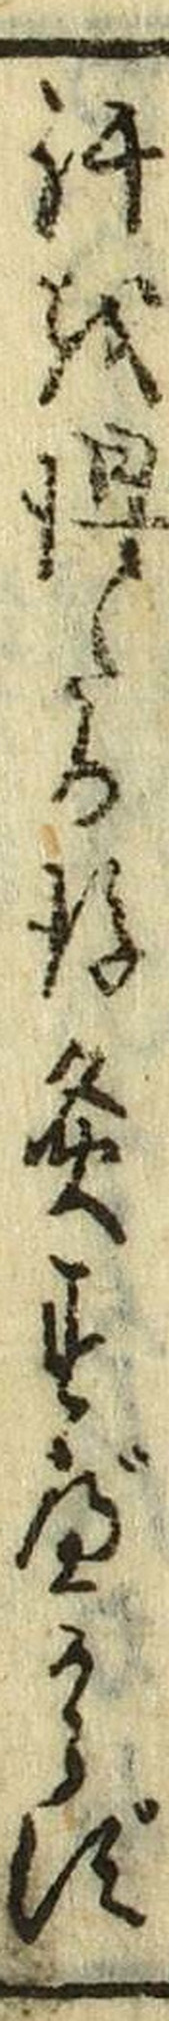汗を得たる後灸すべからず
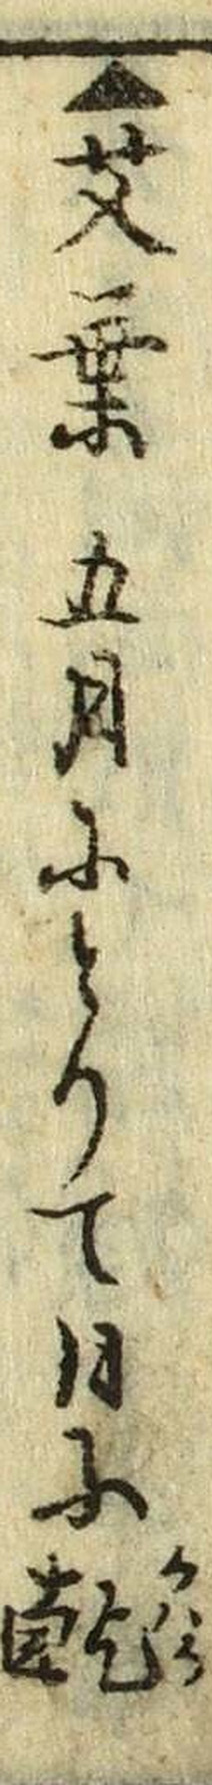▲艾葉五月にとりて日に乾
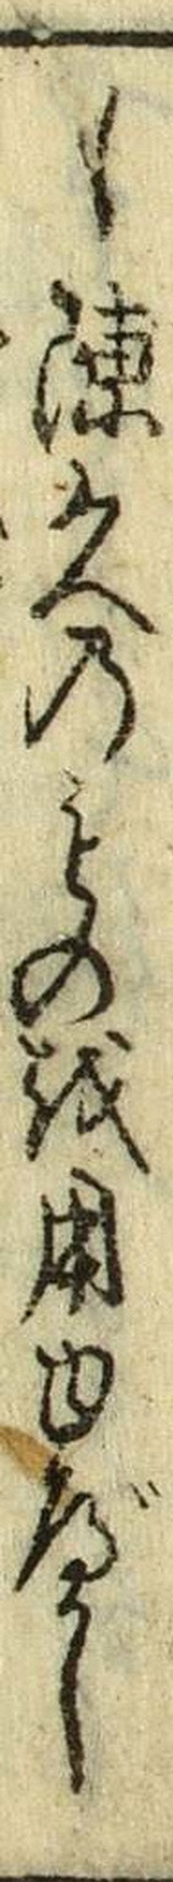し陳久のものを用ゆべし
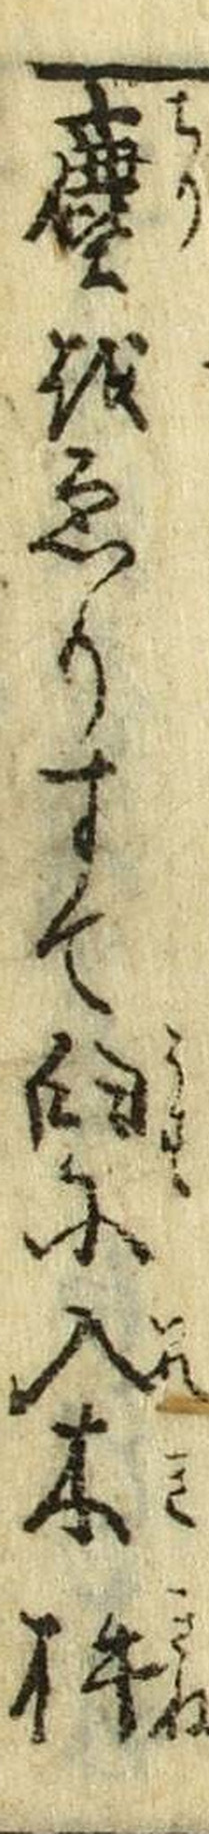塵をゑりすて臼に入木杵

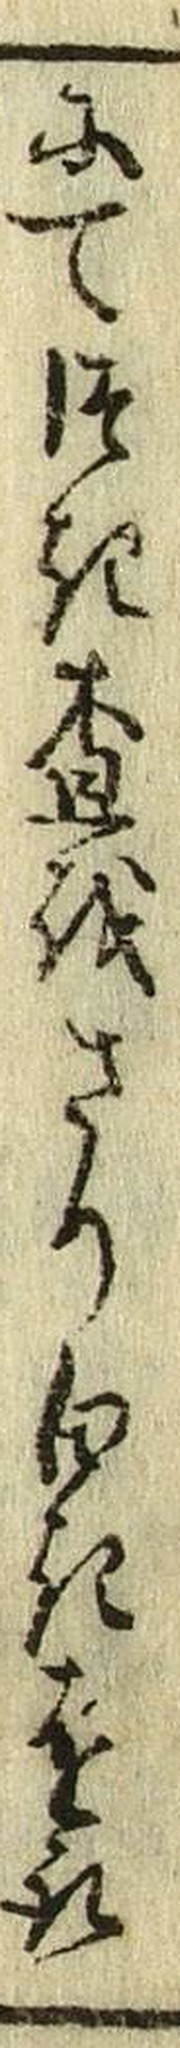にてつき査をさり白きを取
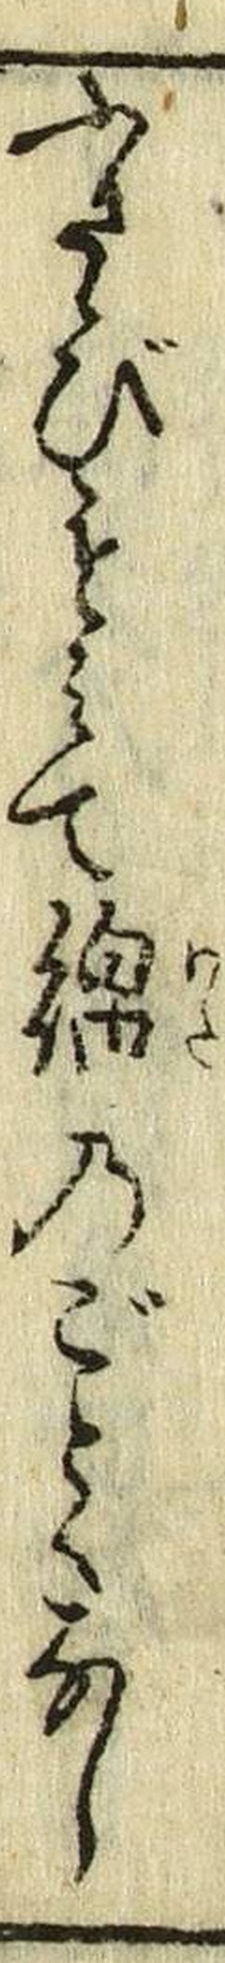ふたゝびもみて綿のごとくなし
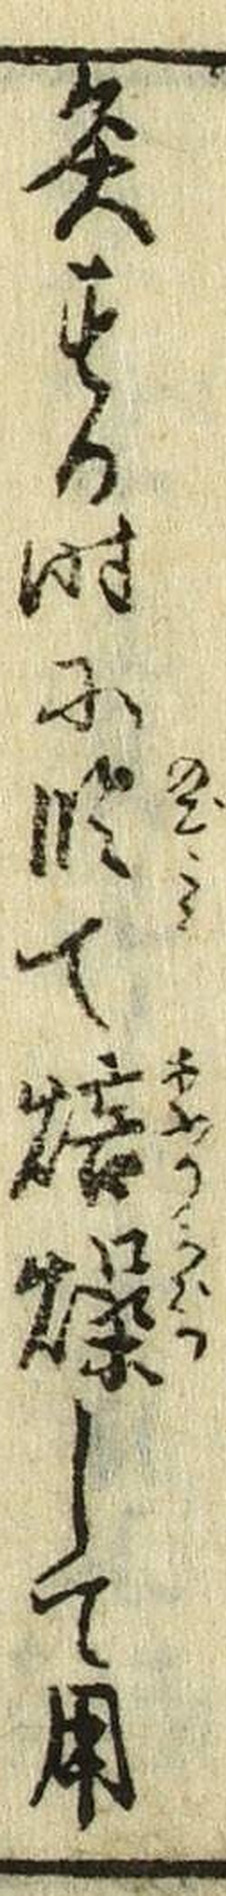灸する時に臨て焙燥して用
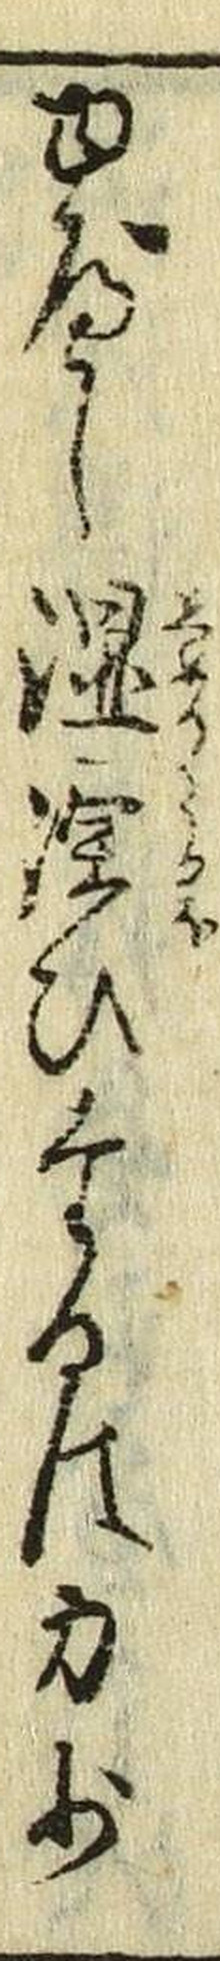ゆへし湿潤ひたるは力少
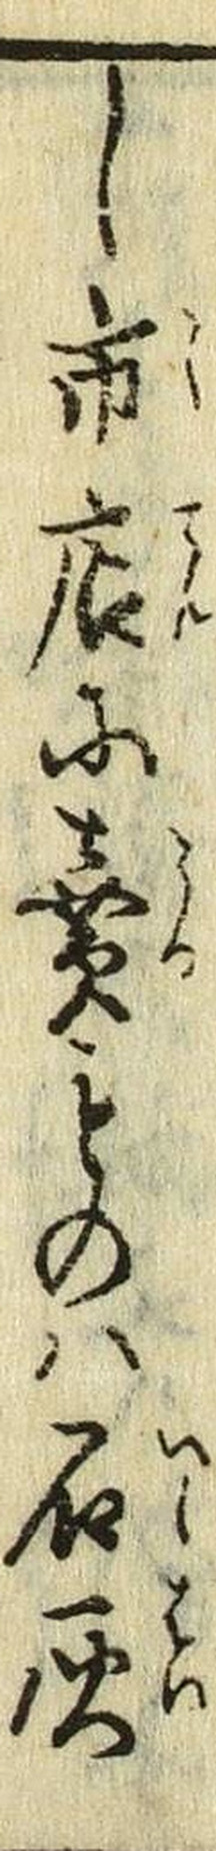し市店に売ものは石灰
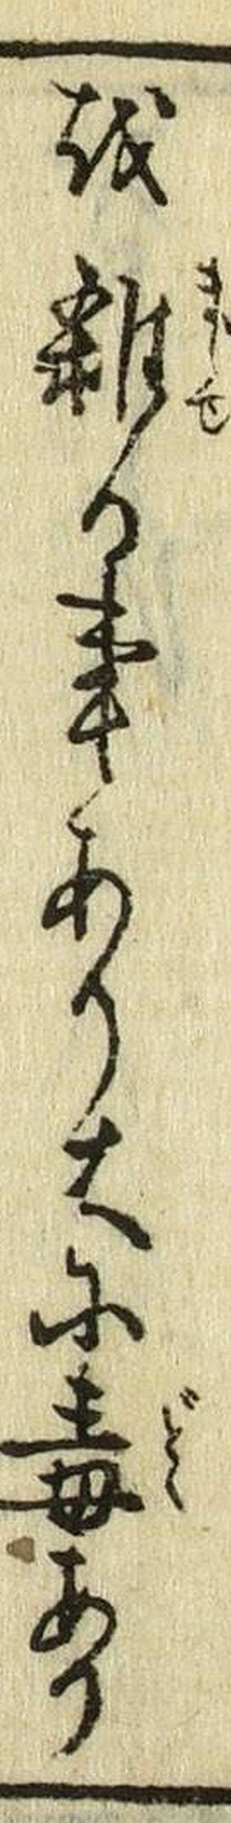を雑る事あり大に毒あり
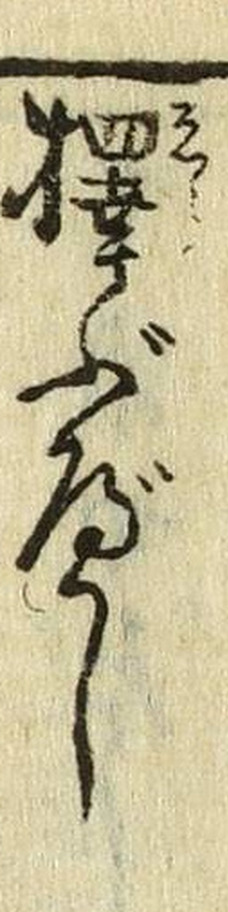択ぶべし
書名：居家養生記
